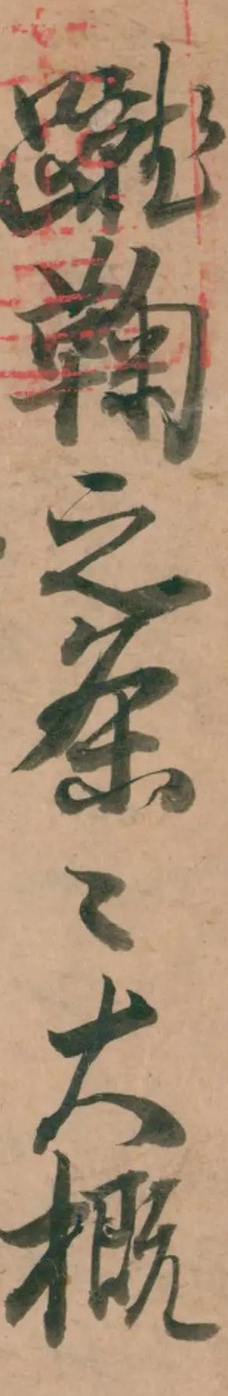蹴鞠之条々大概
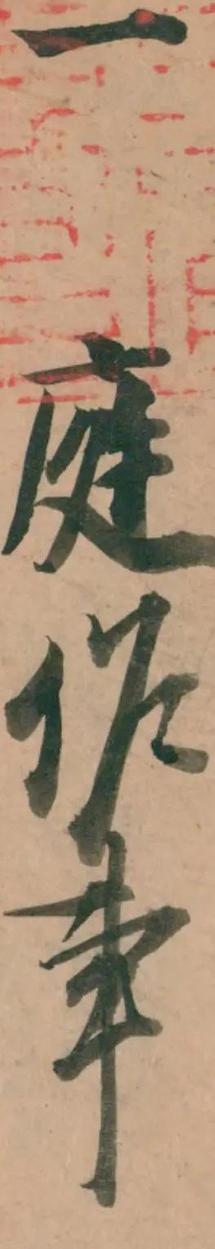一庭作事
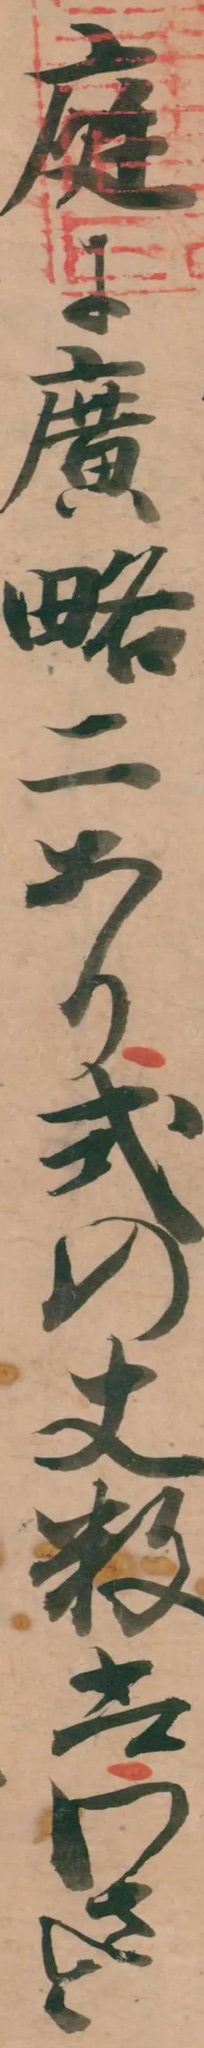庭に広略二あり式の丈数はわさと
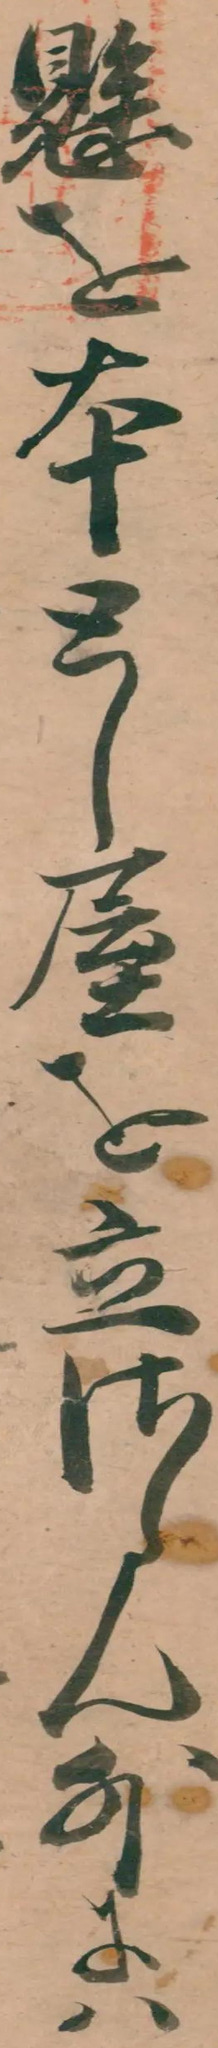懸を本とし屋を立さらん外にハ
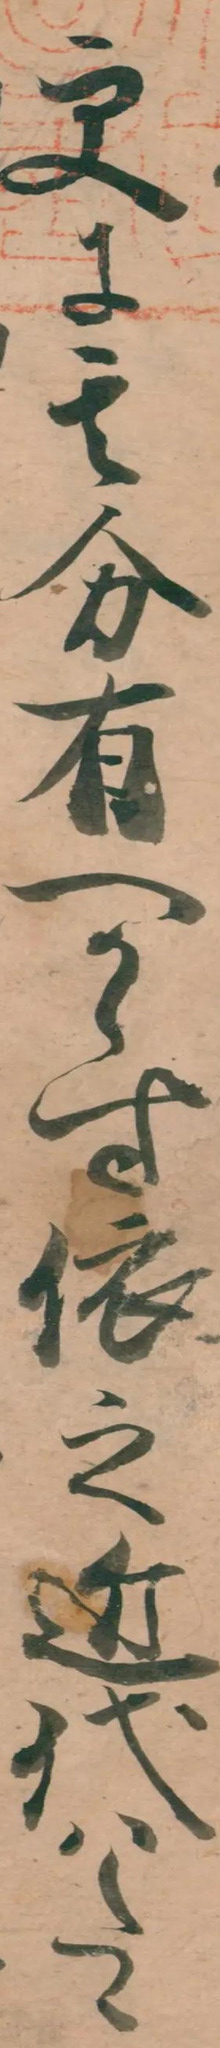更に其分有へからす依之近代ハたゝ
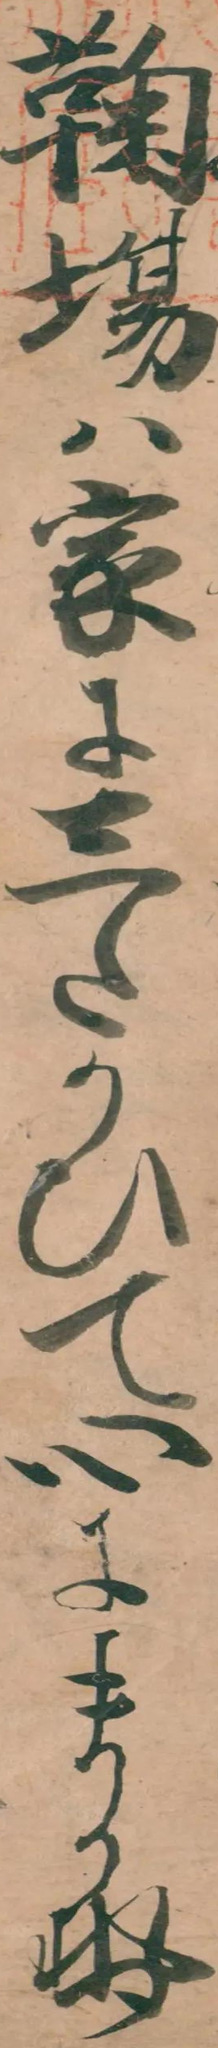鞠場ハ家にしたかひて心にまかせ
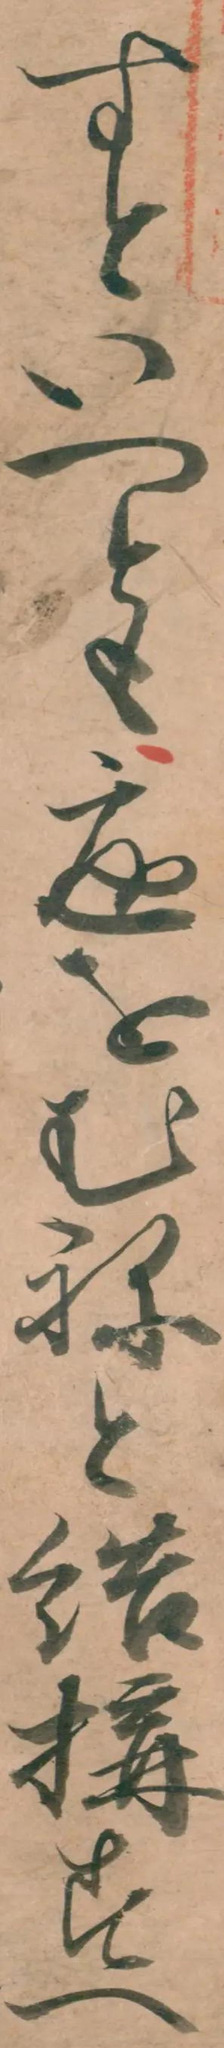すといへとも庭をむねと結構すへ
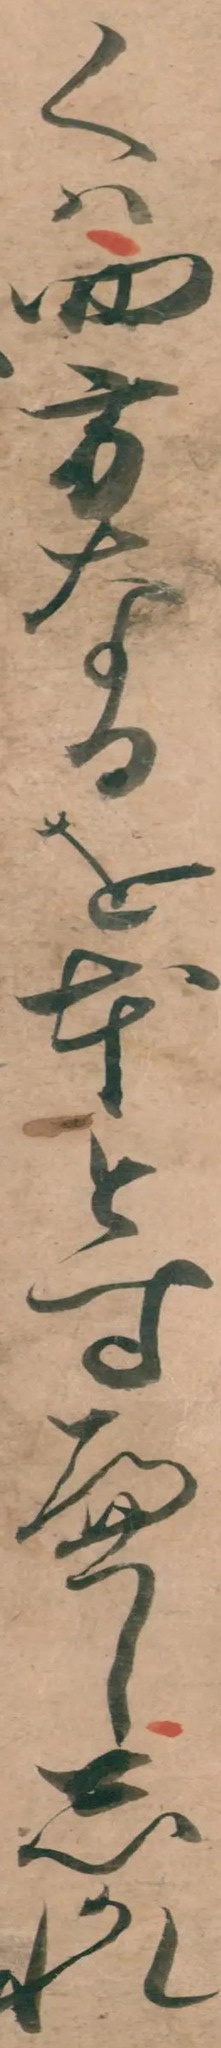くハ四方なるを本とすへししかれ
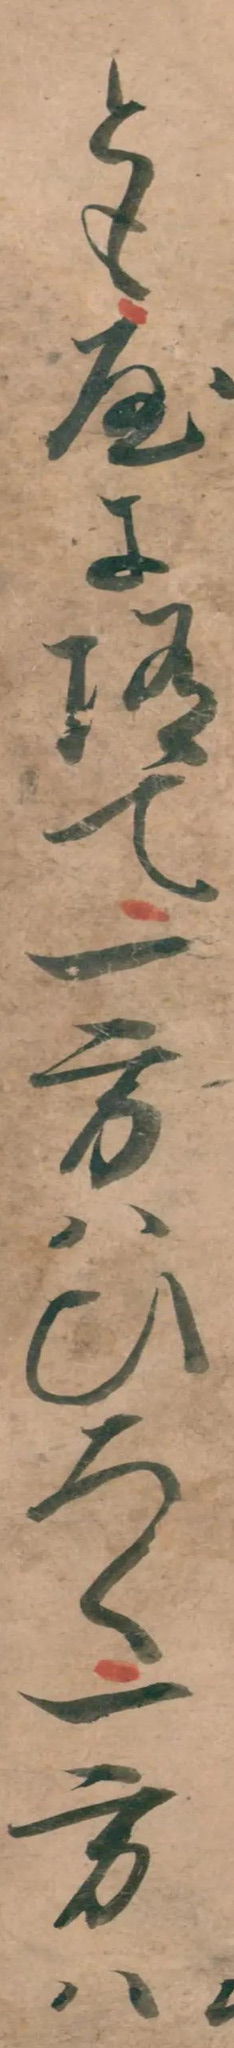とも屋に随て一方ハひろく一方ハ

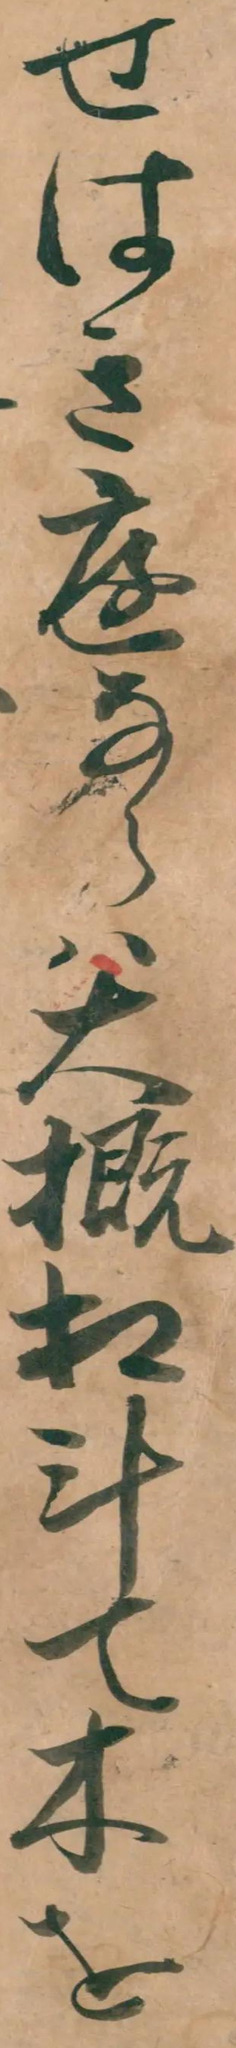せはき庭ならハ大概相計て木を
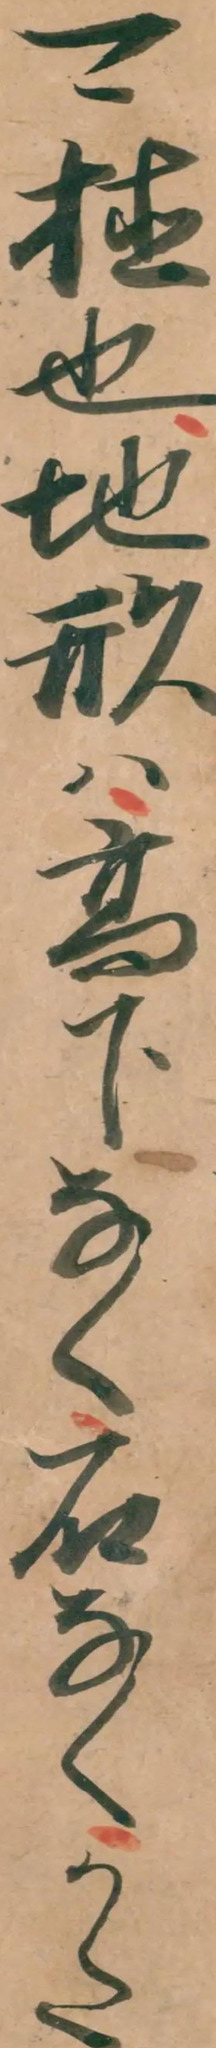可植也地形ハ高下なく石なくかた
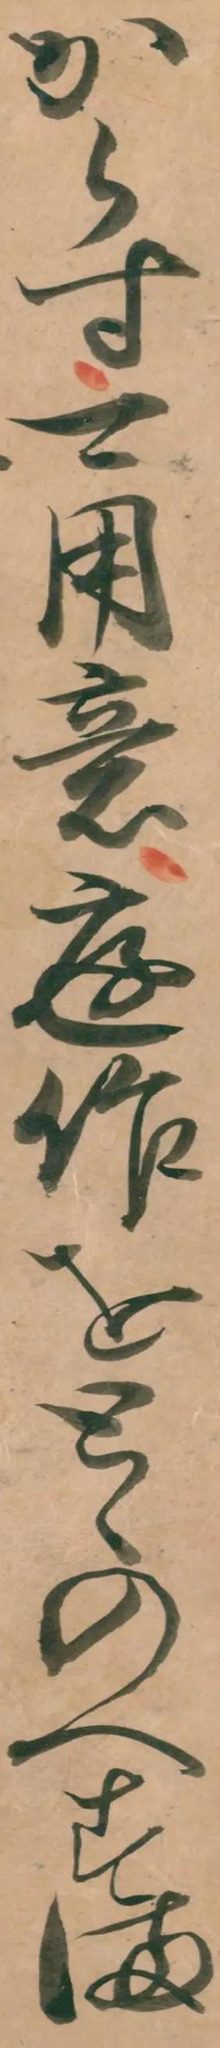からす可用意庭作をとゝのへすま
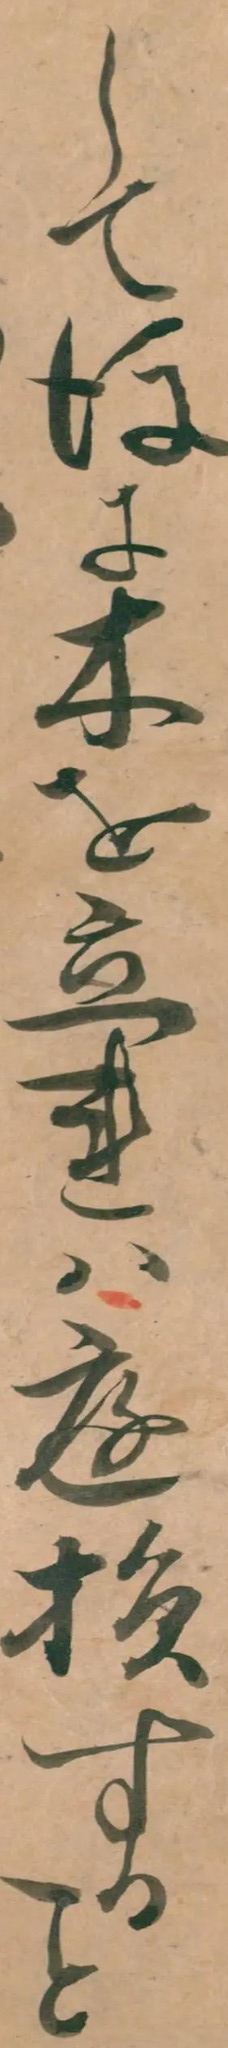して後に木を立れハ庭損すること
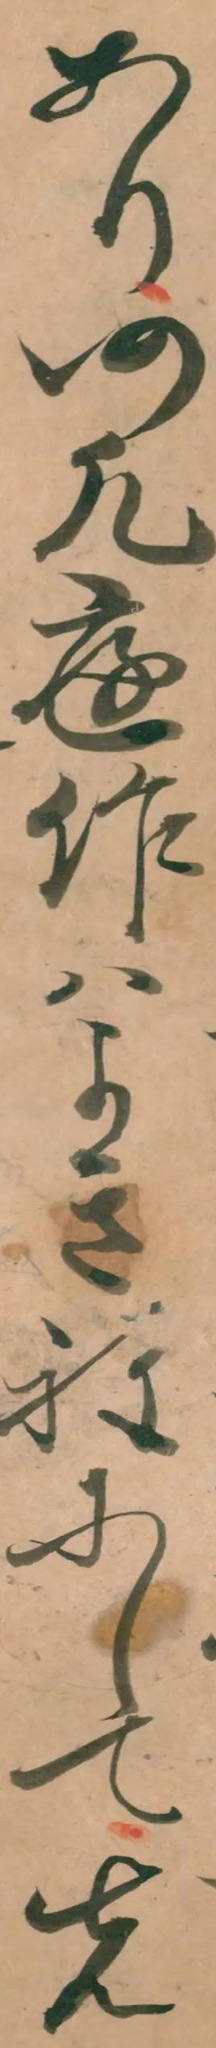あり仍凡庭作ハよき程にして先
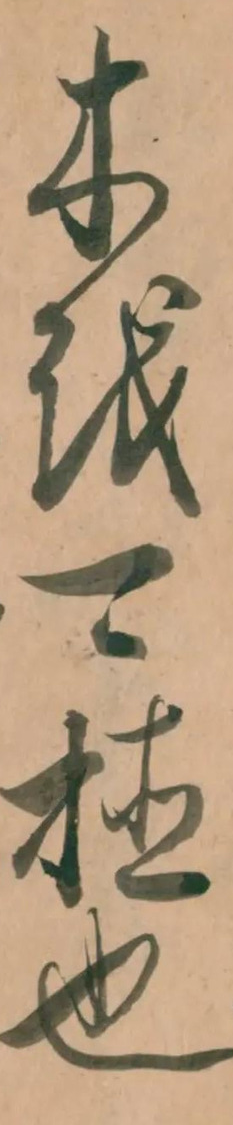木を可植也
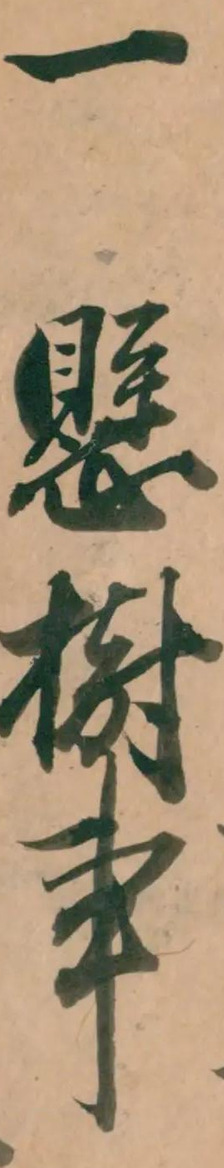一懸樹事
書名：蹴鞠之条々大概
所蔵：国立国会図書館 National Diet Library, JAPAN
